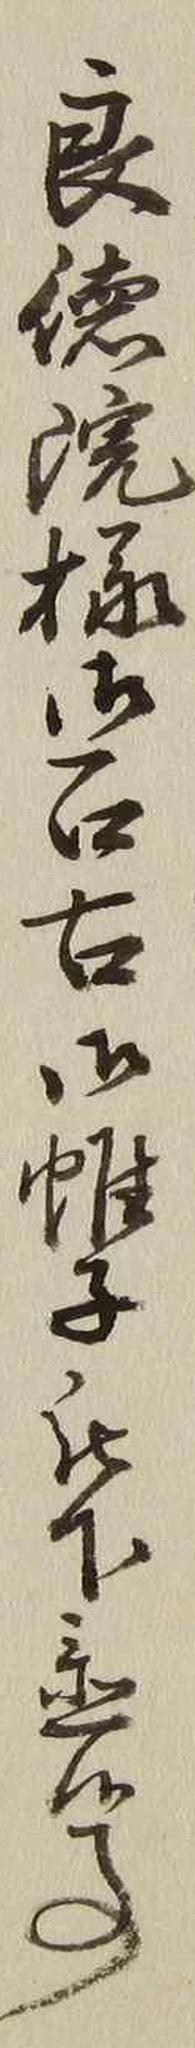良徳院様御召古御帷子被下置候事
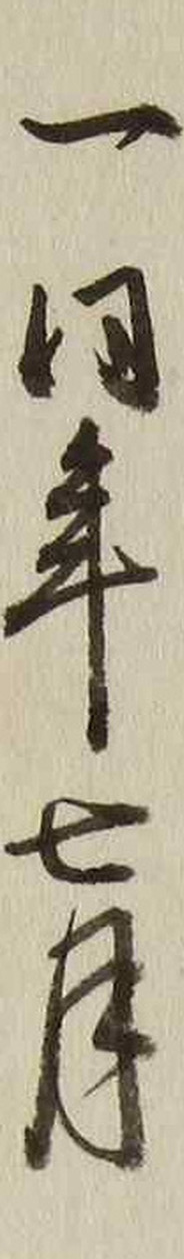一同年七月
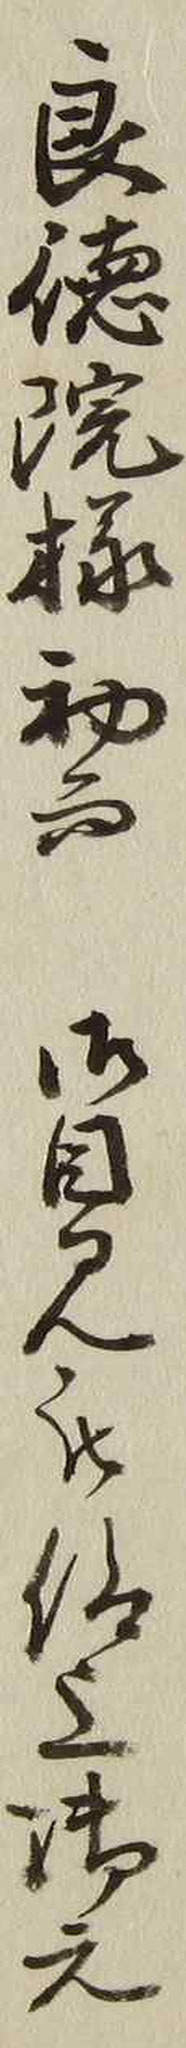良徳院様初而御目見被仰上御元
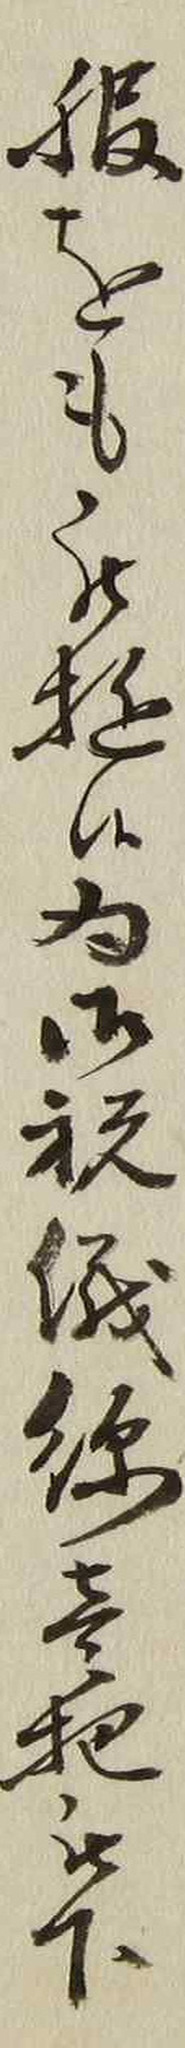服をも被遊候為御祝儀綿壱把被下
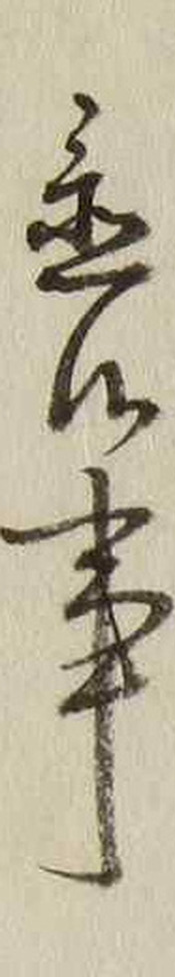置候事
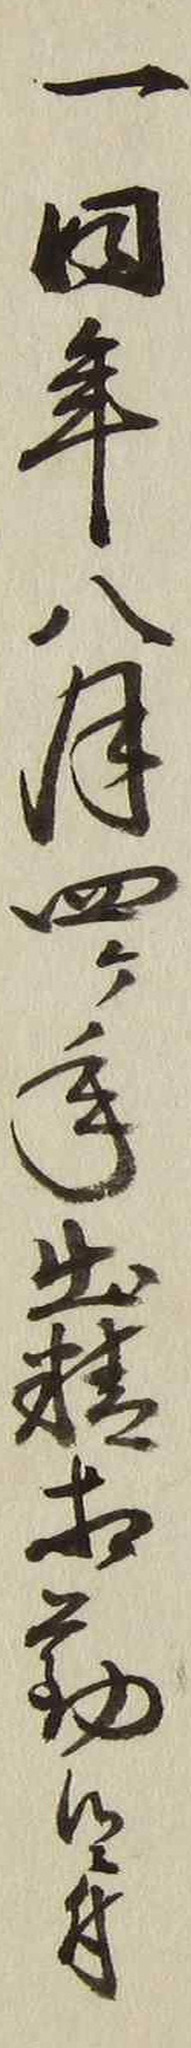一同年八月四ケ年出精相勤候ニ付
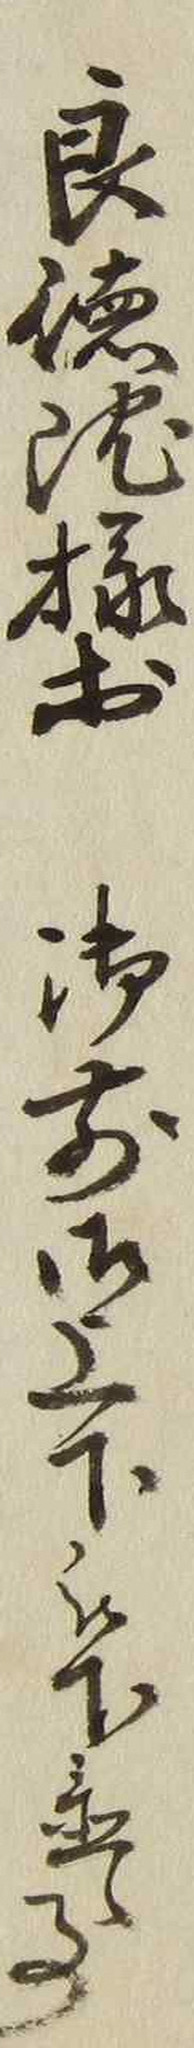良徳院様於御前御上下被下置候事

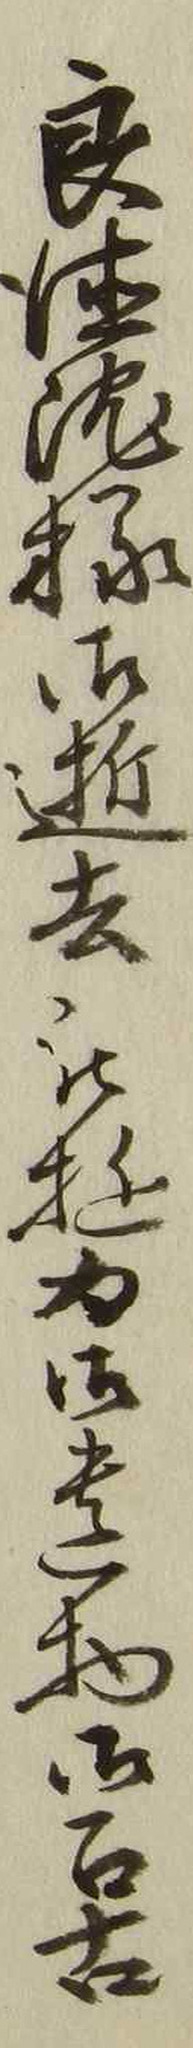良徳院様御逝去被遊為御遺物御召古
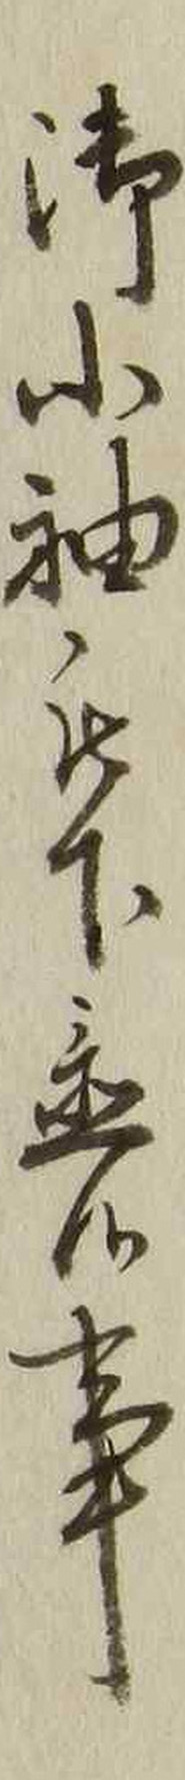御小袖被下置候事
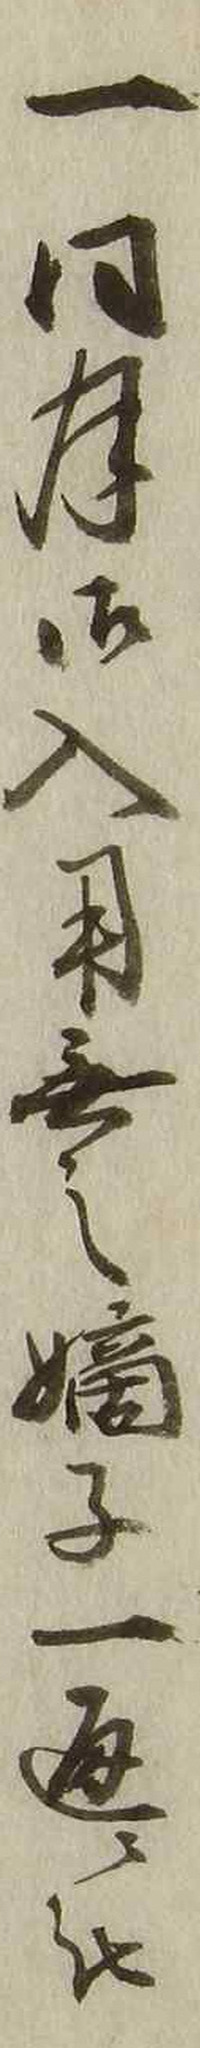一同月御入用無之嫡子一通ニ被
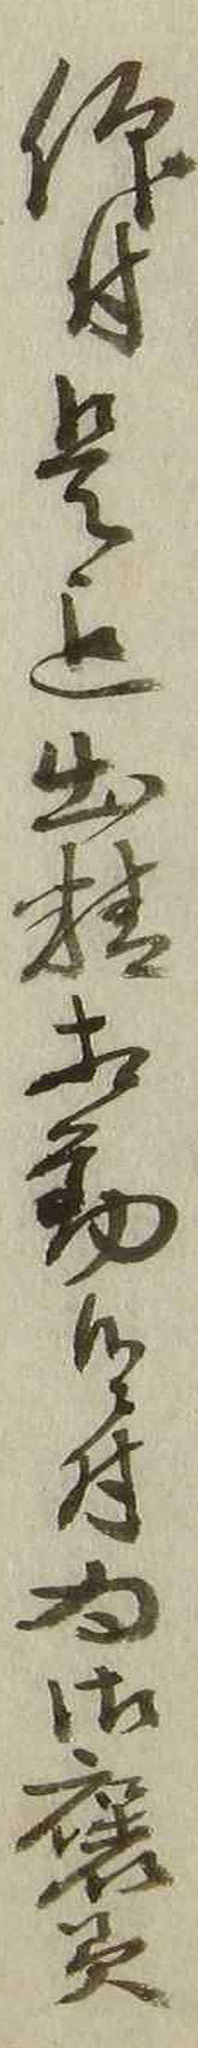仰付是迄出精相勤候ニ付為御褒美
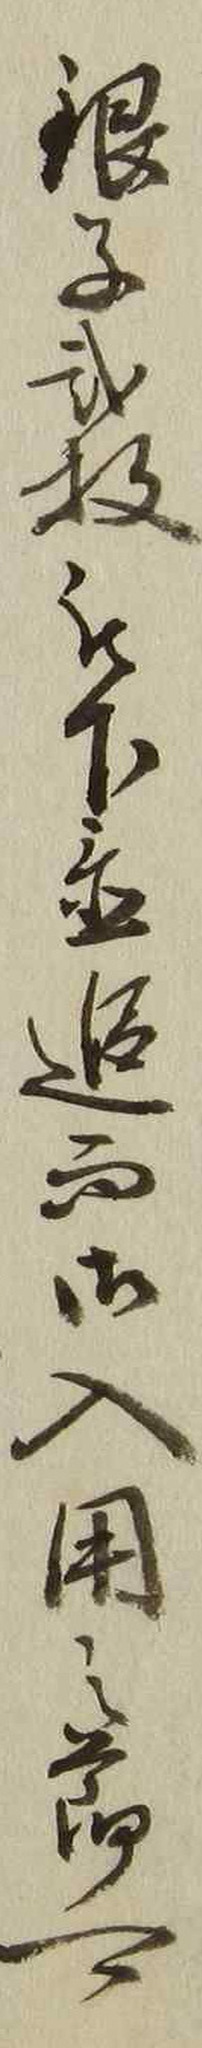銀子弐枚被下置追而御入用之節可
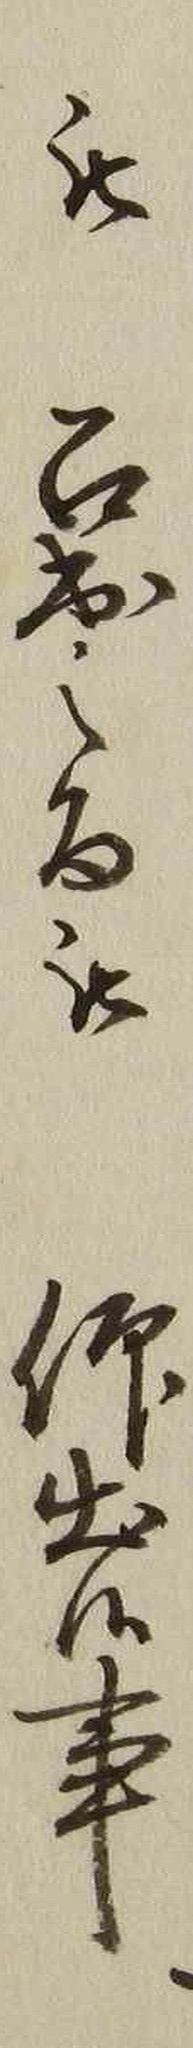被召出之旨被仰付候事
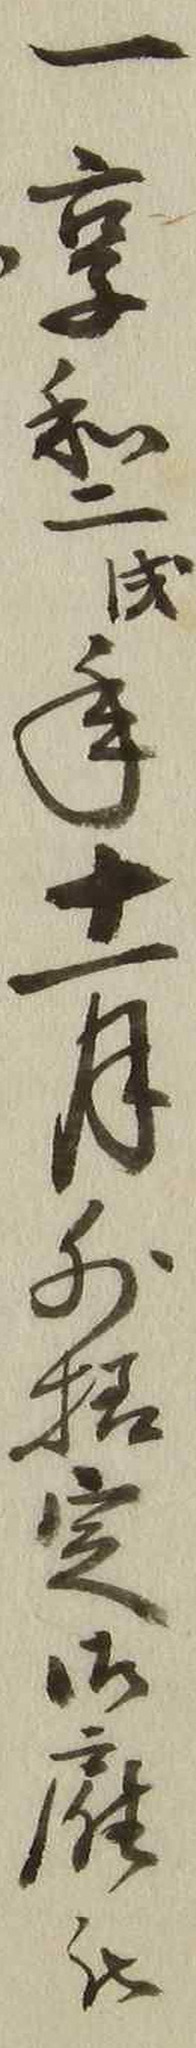一享和二戌年十一月外様定御雇被
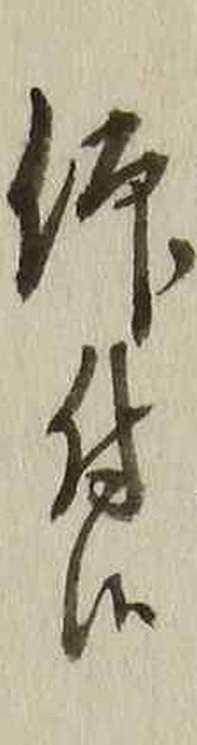仰付候
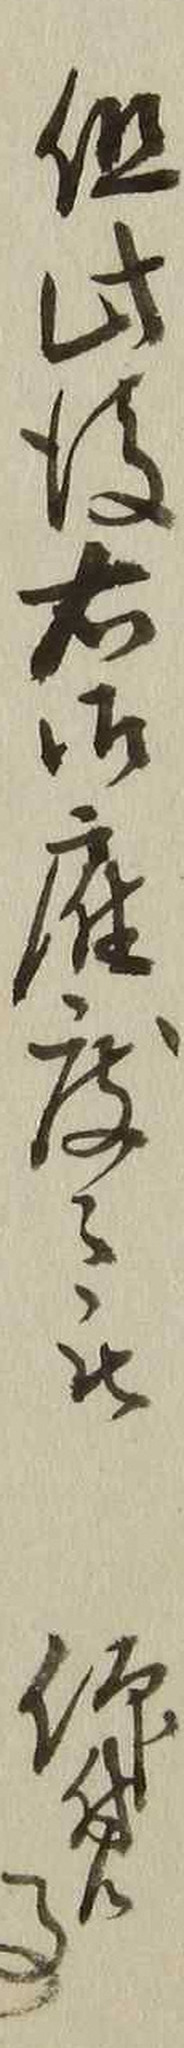但此後右御雇度々被仰付候事
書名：諸士系譜　巻之31　い之部31
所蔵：会津若松市立会津図書館
